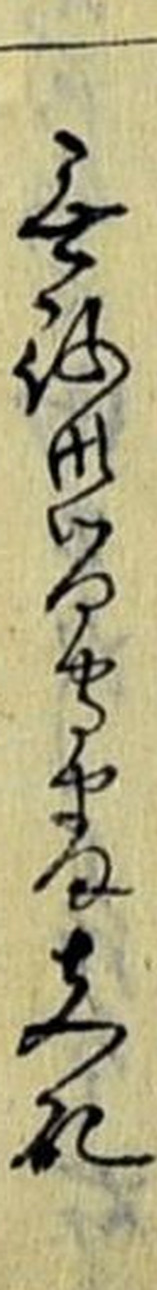無役御留守番支配
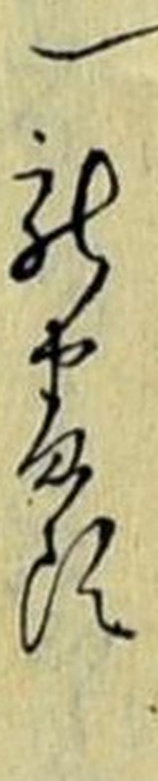新番頭
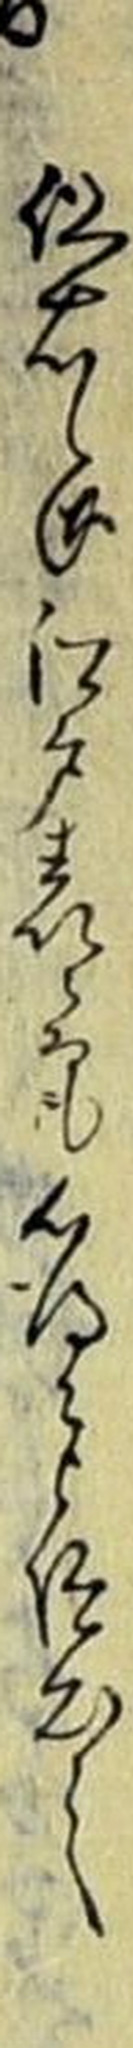同日但右之趣江戸表に而も心得に被仰出之
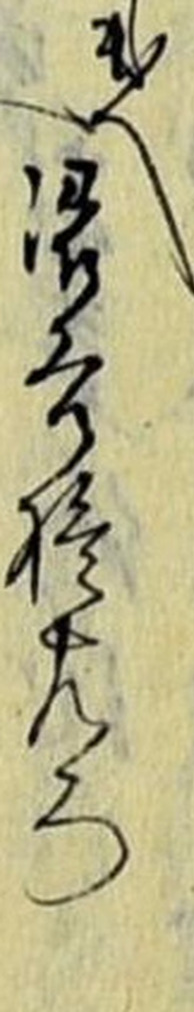渋谷権左衛門
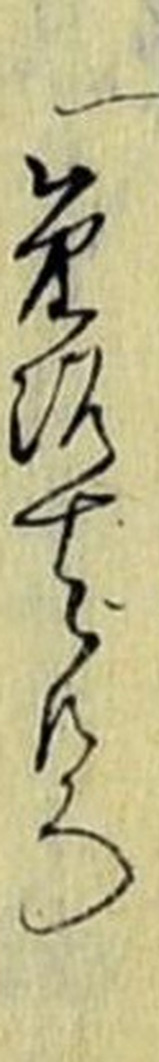菅沼十郎左衛門
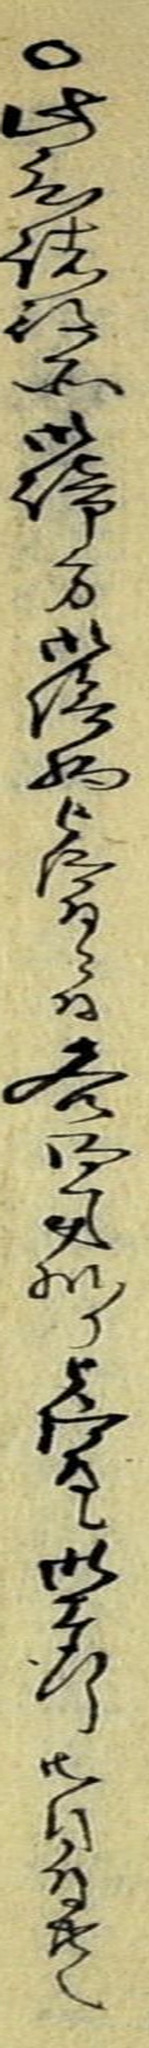○此度諸役所御締り方御倹約被仰付候に付各御用掛り被仰付候御奉行御目付共之
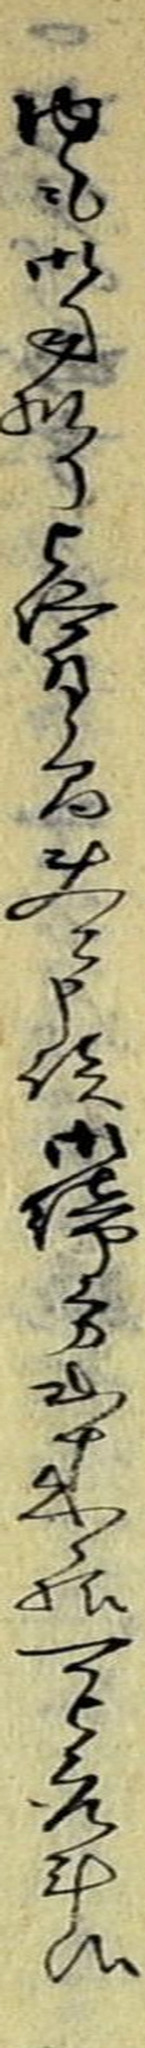内へも御用掛り被仰付候間夫々申談御締り方出来候様可被取斗候
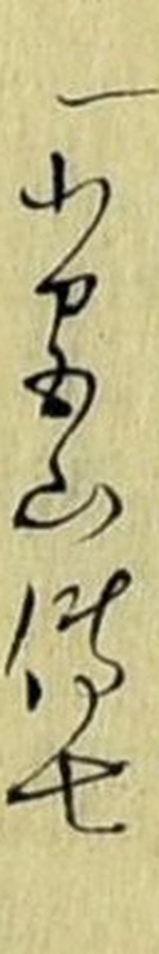小宮山伝七
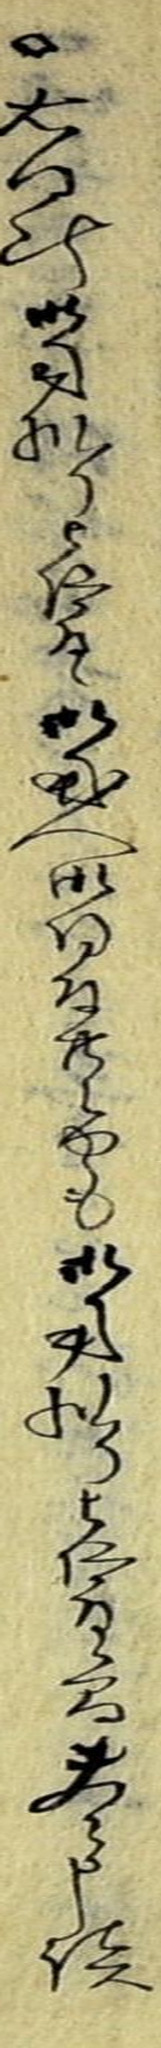○右同断御用掛り被仰付候御用人御目付共之内へも御用掛り被仰付候間夫々申談
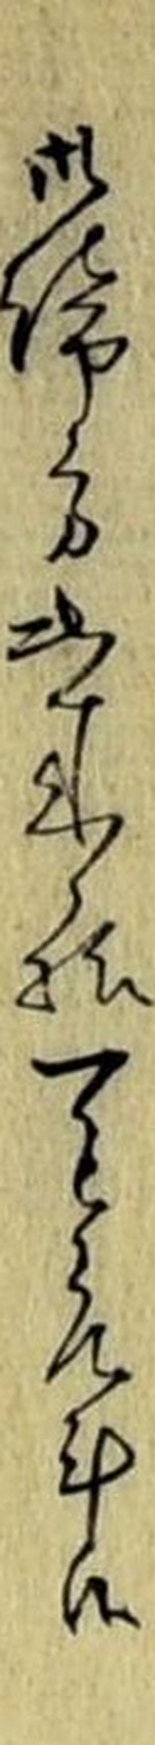御締方出来候様可被取斗候
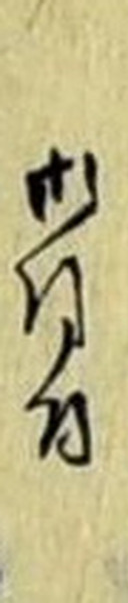御目付
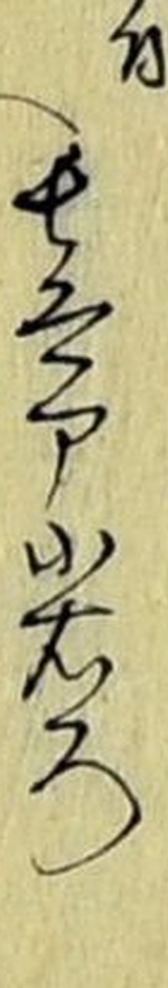長谷部小右衛門
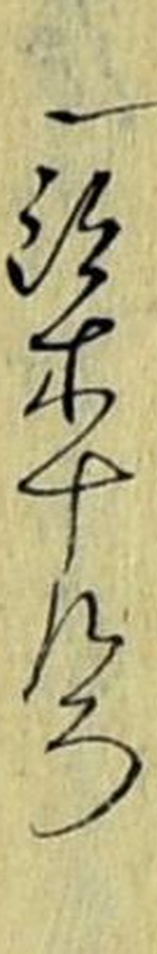鈴木十左衛門

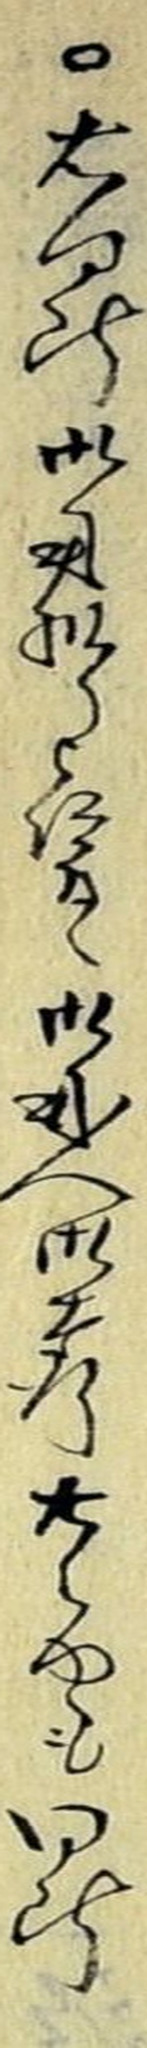○右同断御用掛り被仰付候御用人御奉行共之内へも同断
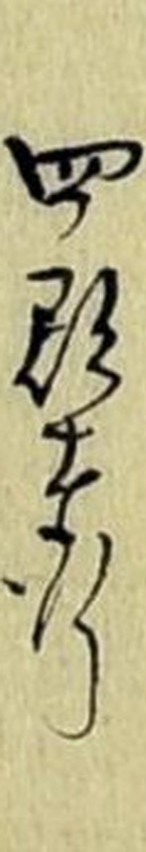四郡奉行
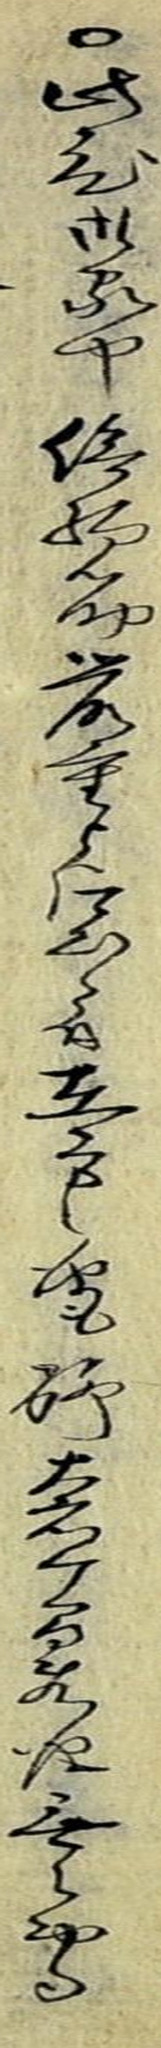○此度御家中倹約筋厳重被仰出候に付在方之儀も聊奢ヶ間敷儀無之専
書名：命令之部 四
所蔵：福井県文書館 Fukui Prefectural Archives
